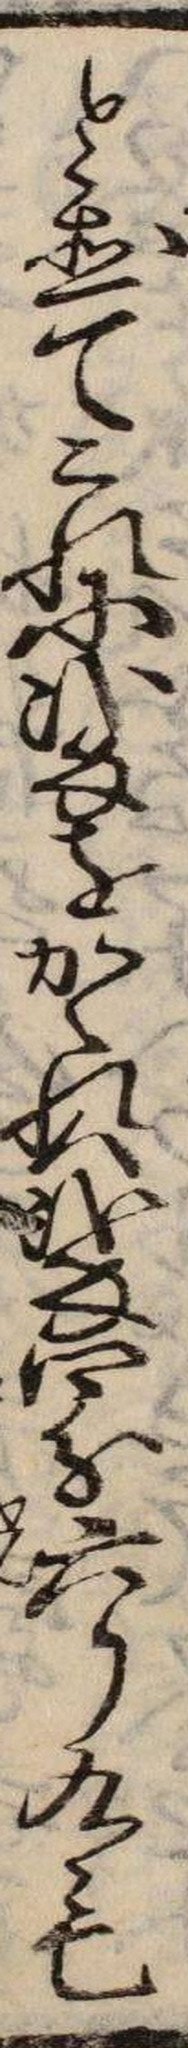と置てこれに弍匁をかくれは弍匁四分六り九毛
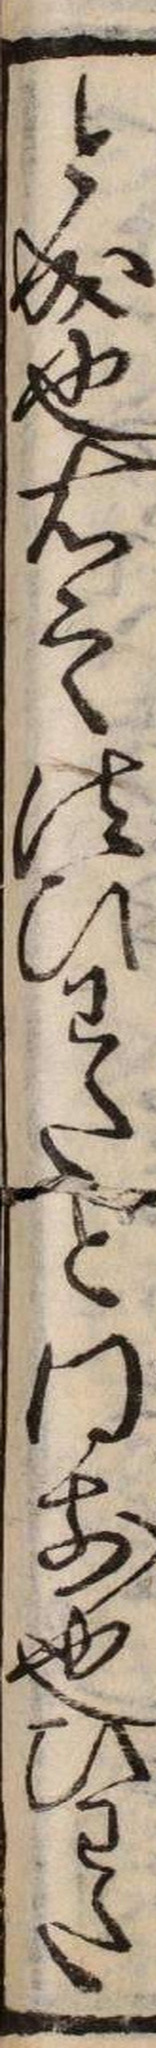と成也右之法ひわたと同前也ひわた
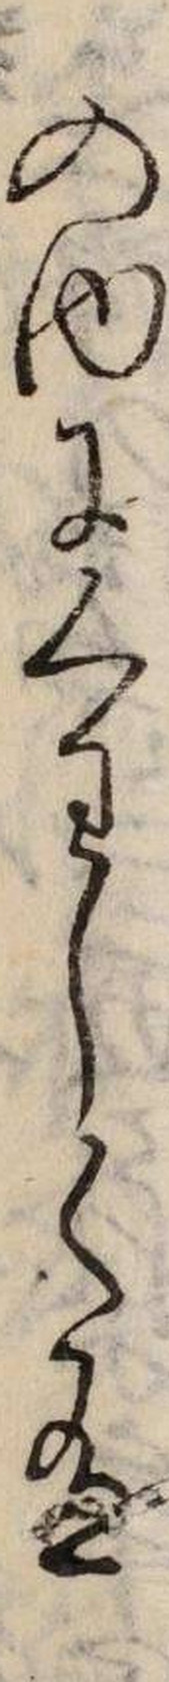の内にくわしく有
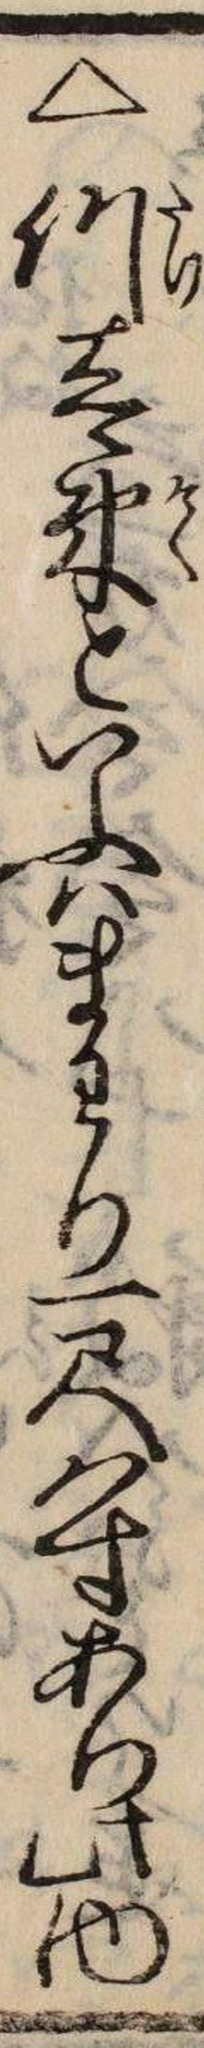△竹壱束といふはまわり一尺八寸あり此内
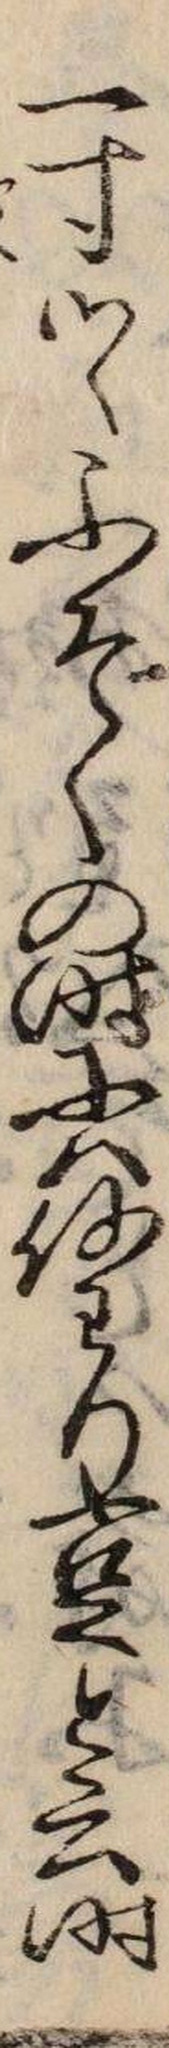一寸づつふそくの時には何わりふ足と云時
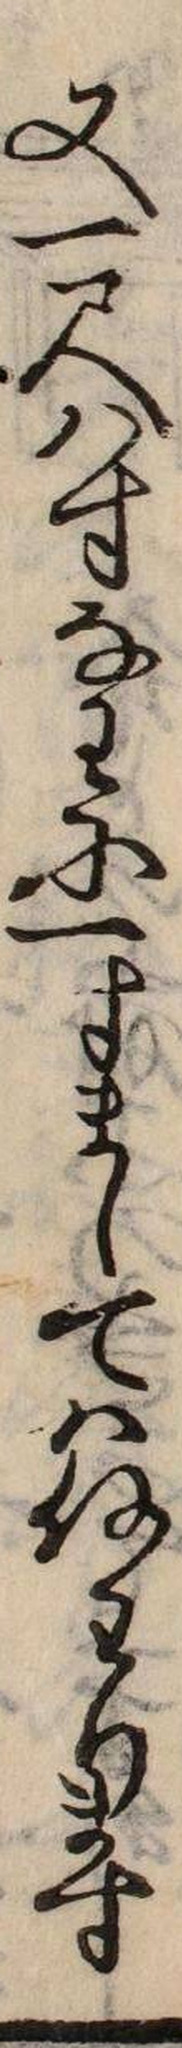又一尺八寸なわに一寸ましては何わります
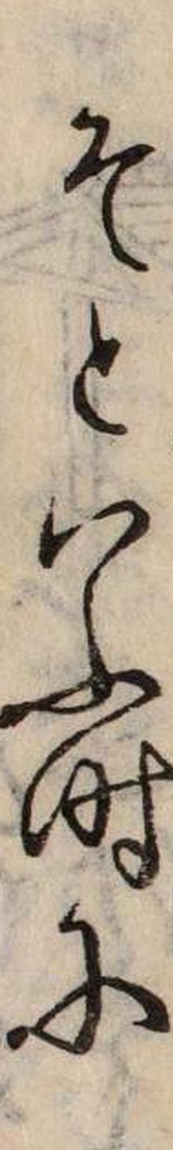そといふ時に

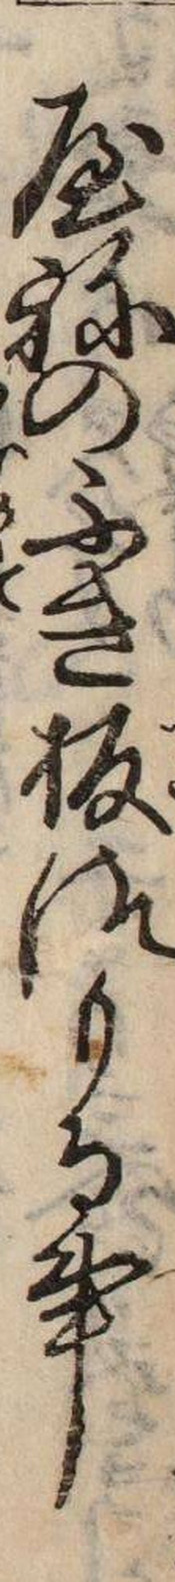第九屋ねのふき板つもる事
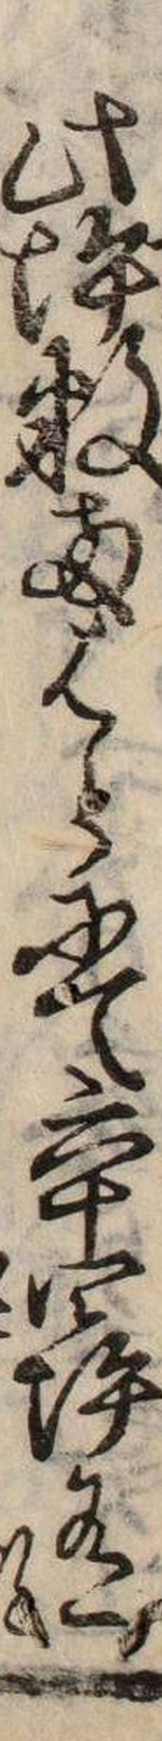此坪数両はらにて六十四坪有
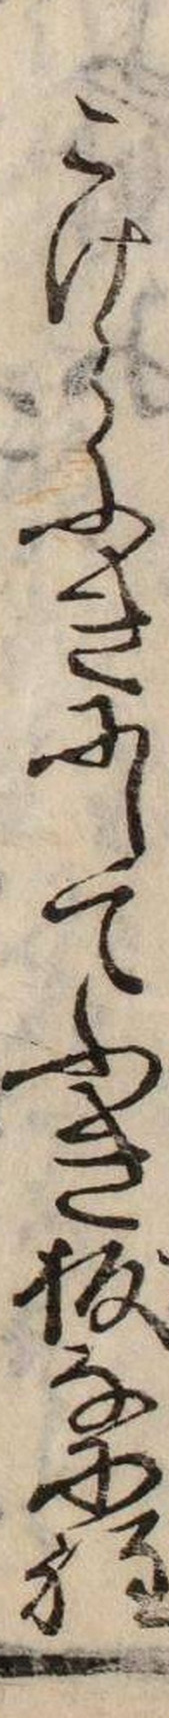こけらふきにしてふき板なに程
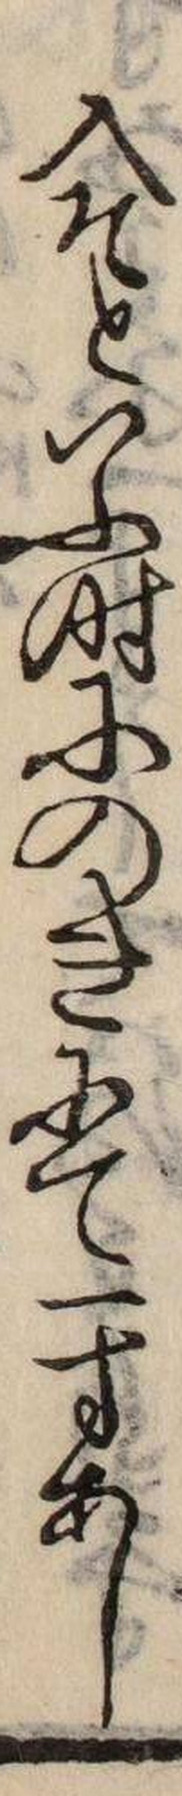入れといふ時にのきにて一寸あし
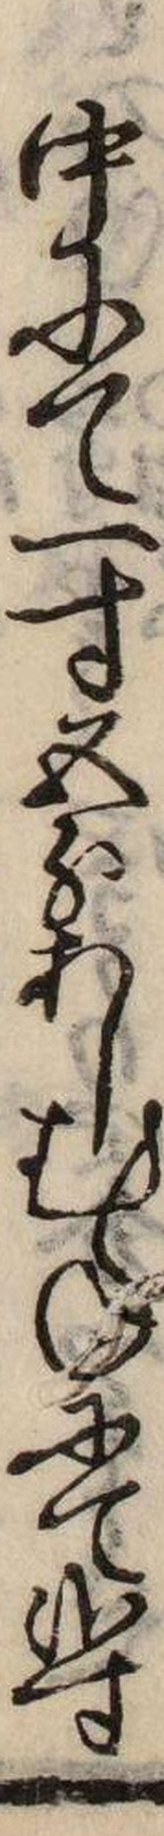中にて一寸五分あしむねにて弍寸
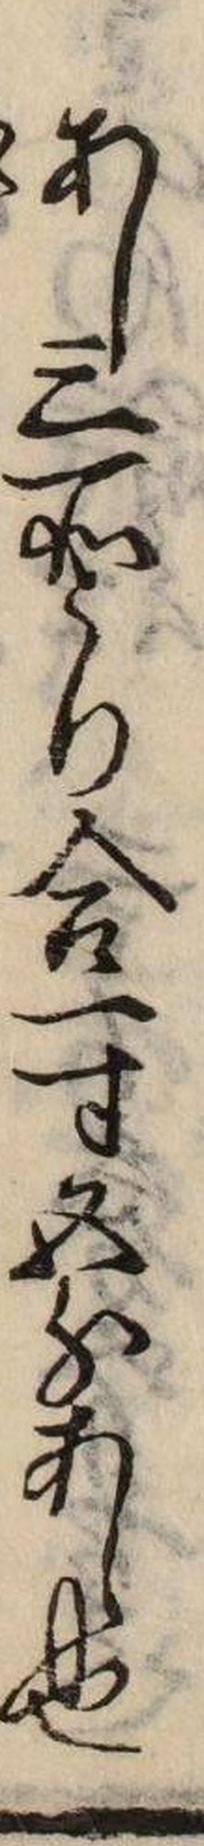あし三所とり合一寸五分ある也
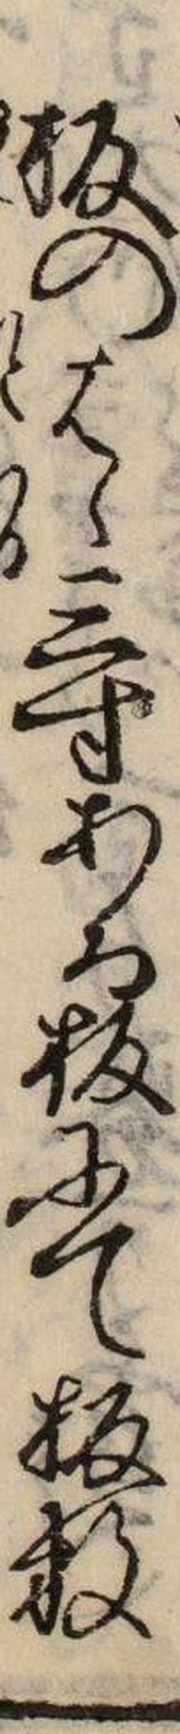板のはは三寸ある板にて板数
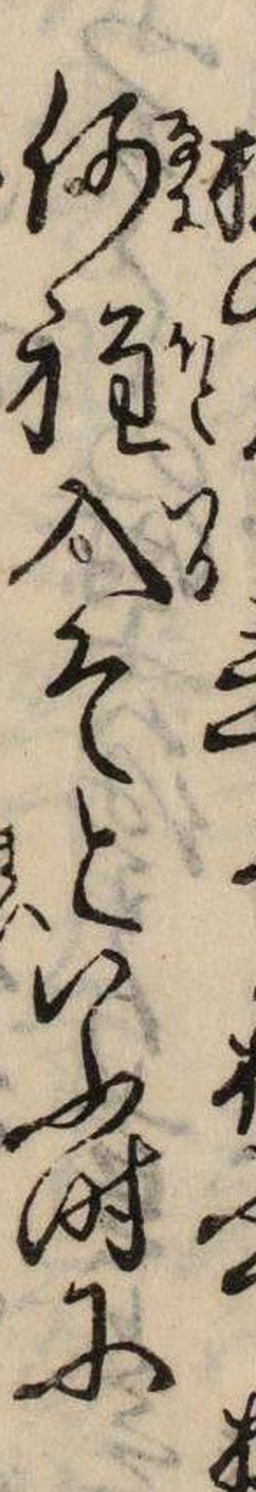何程入そといふ時に
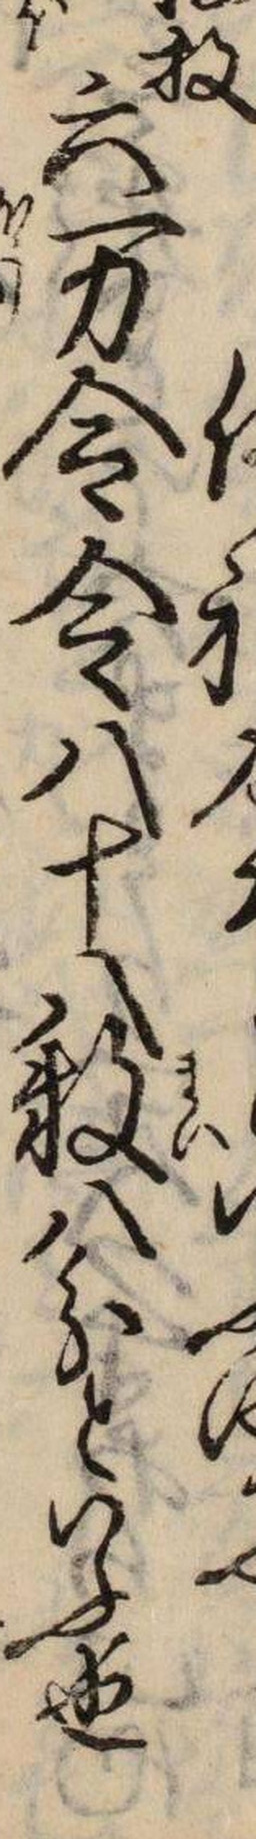板数六万令令八十枚八分という也
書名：塵劫記（寛永11年自跋、京都府立京都学・歴彩館追貴8）
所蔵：京都府立京都学・歴彩館 国文学研究資料館
